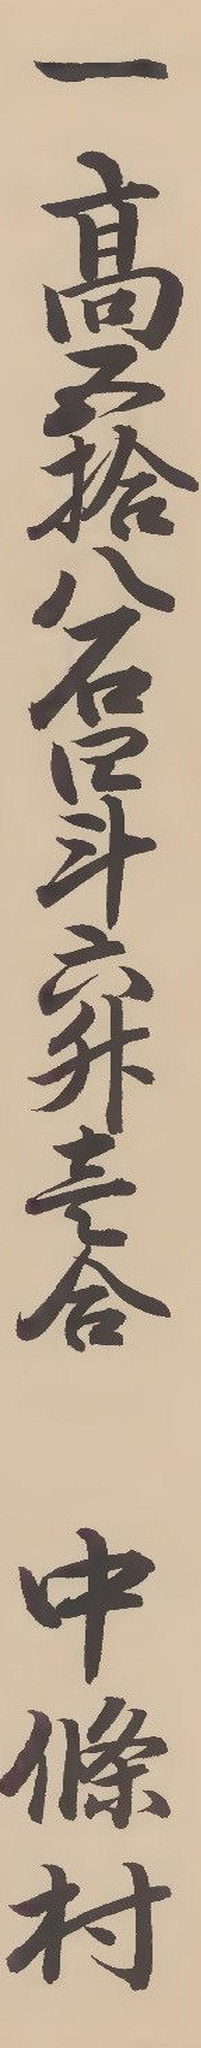一高五拾八石四斗六升壱合中条村
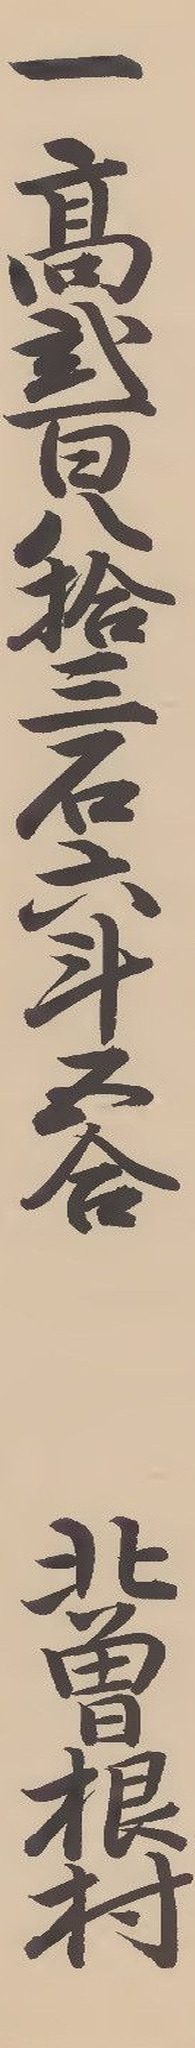一高弐百八拾三石六斗五合北曽根村
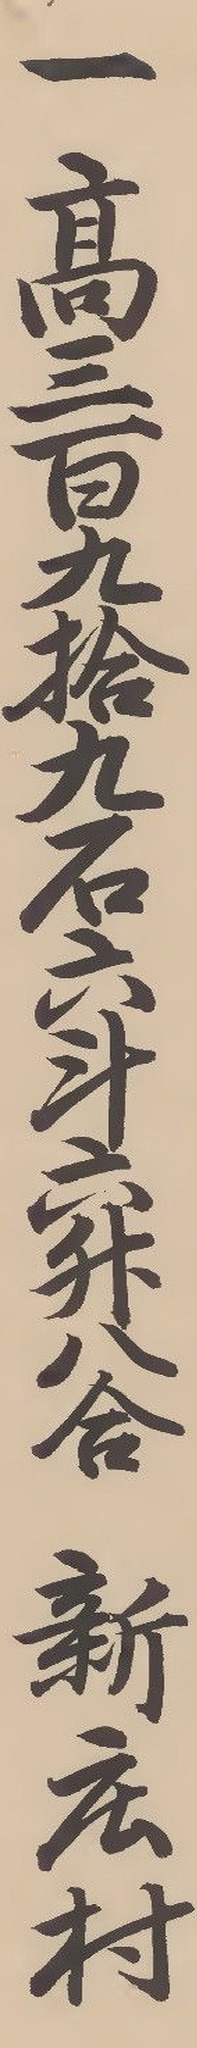一高三百九拾九石六斗六升八合新庄村
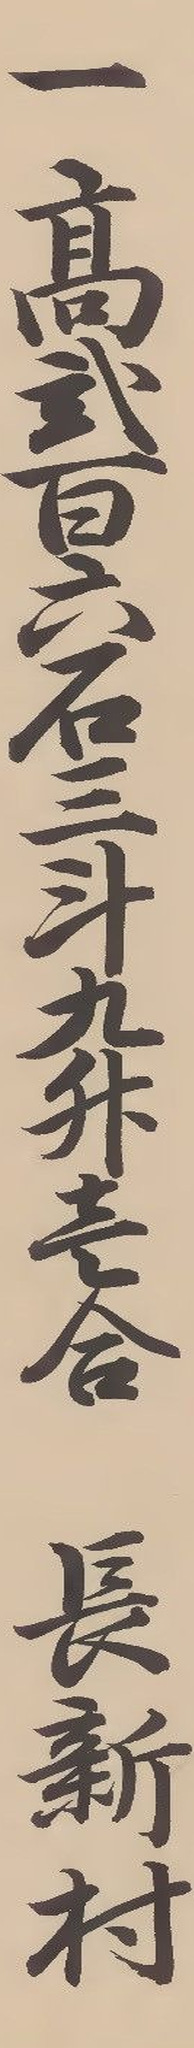一高弐百六石三斗九升壱合長新村
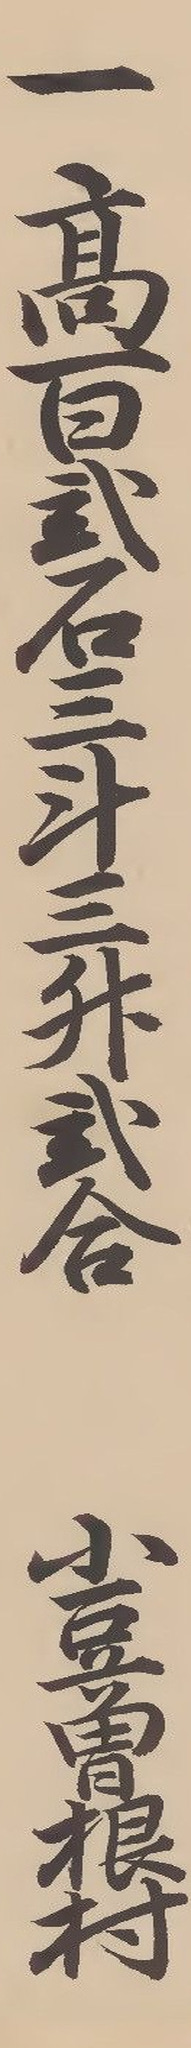一高百弐石三斗三升弐合小豆曽根村

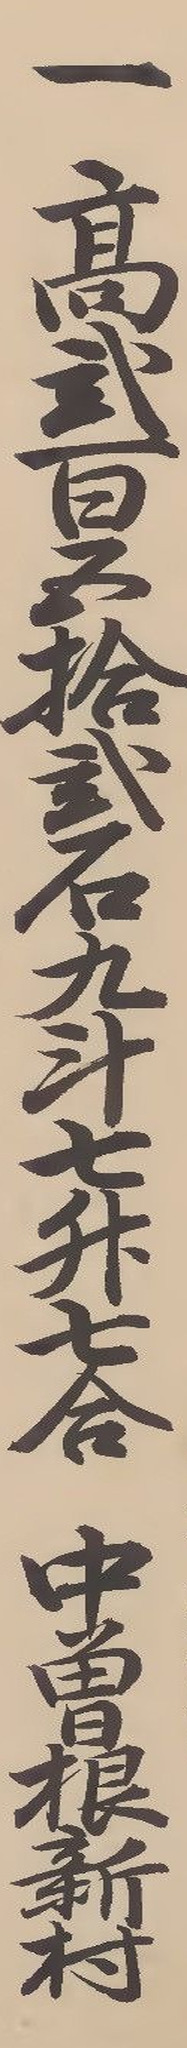一高弐百五拾弐石九斗七升七合中曽根新村
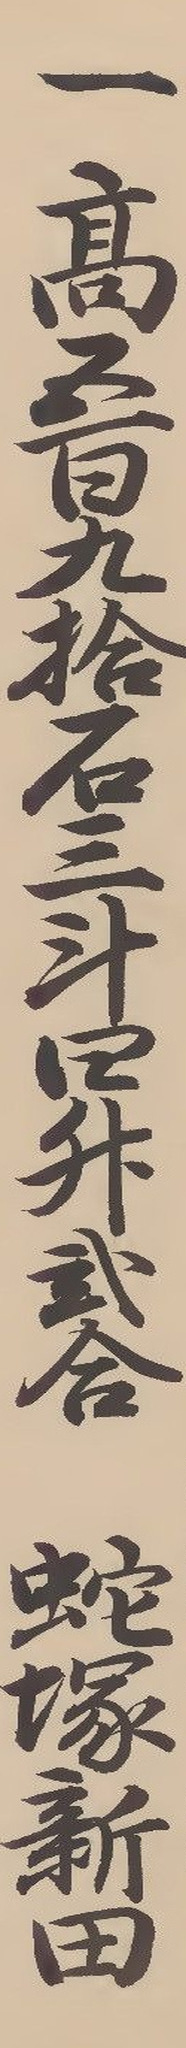一高五百九拾石三斗四升弐合蛇塚新田
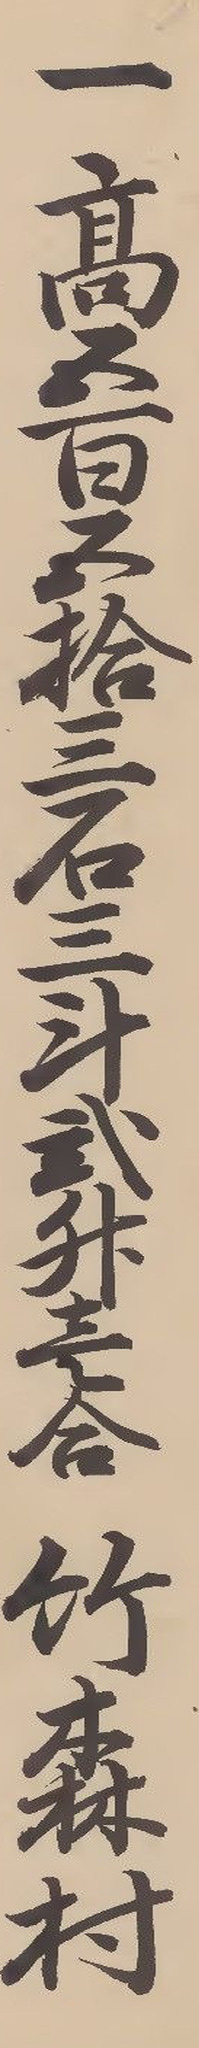一高五百五拾三石三斗弐升壱合竹森村
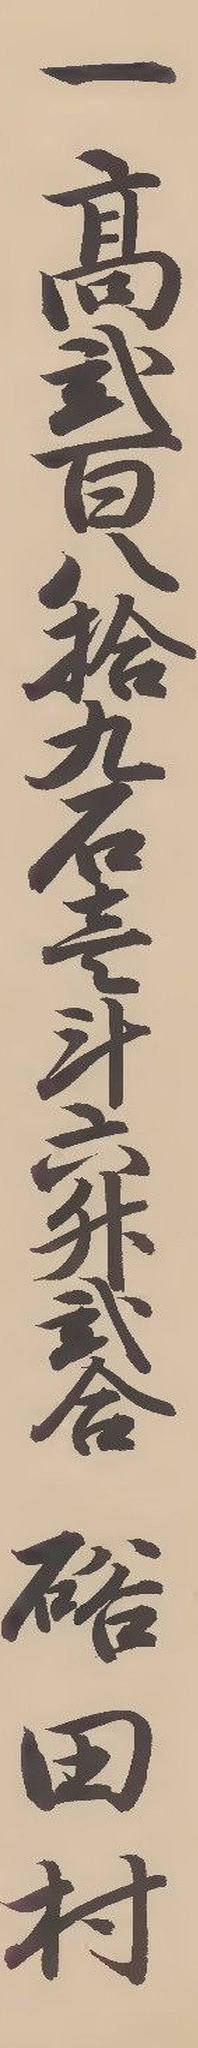一高弐百八拾九石壱斗六升弐合硲田村
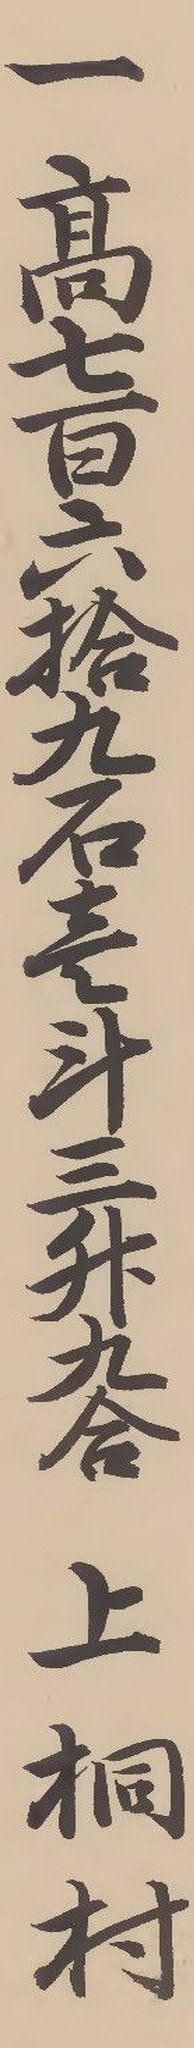一高七百六拾九石壱斗三升九合上桐村
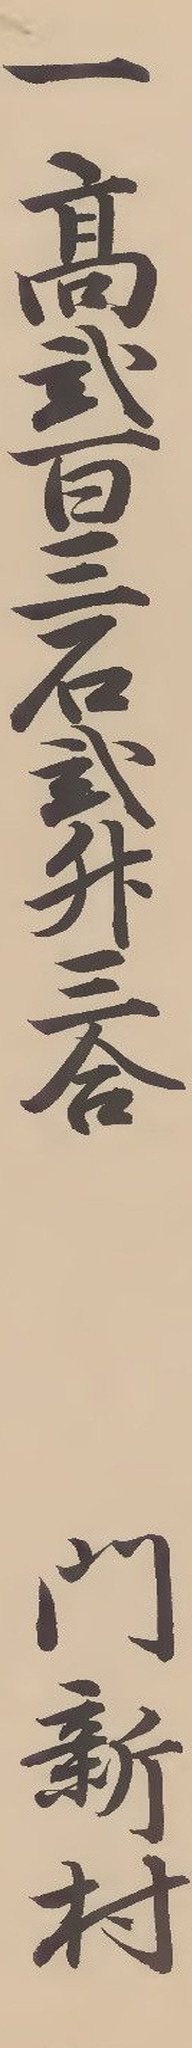一高弐百三石弐升三合門新村
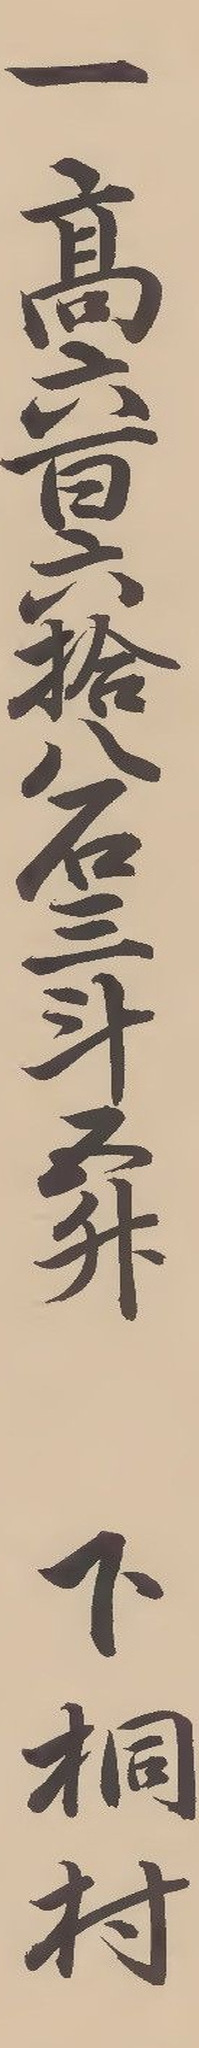一高六百六拾八石三斗五升下桐村
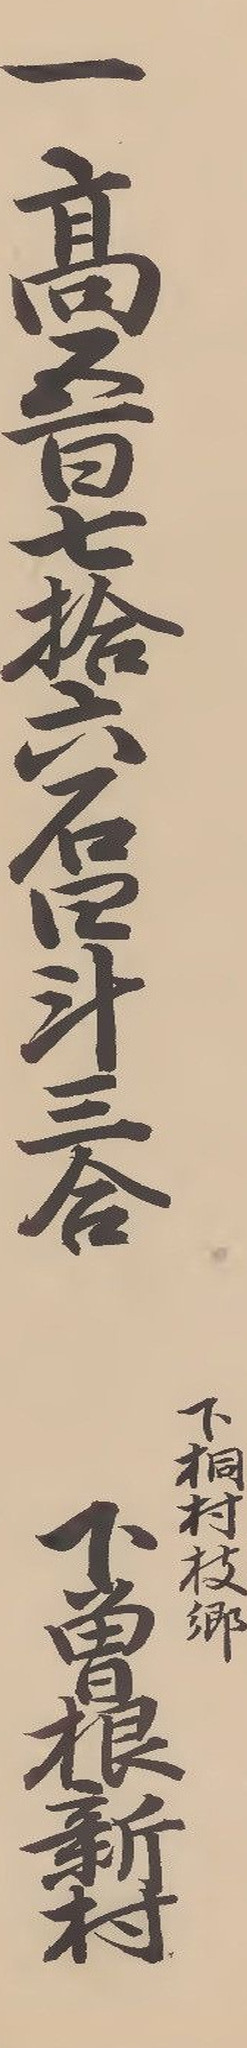一高五百七拾六石四斗三合下曽根新村

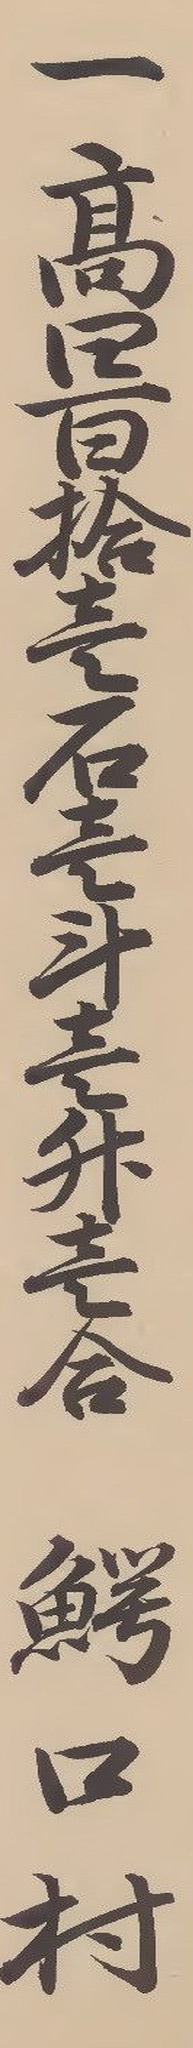一高四百拾壱石壱斗壱升壱合鰐口村
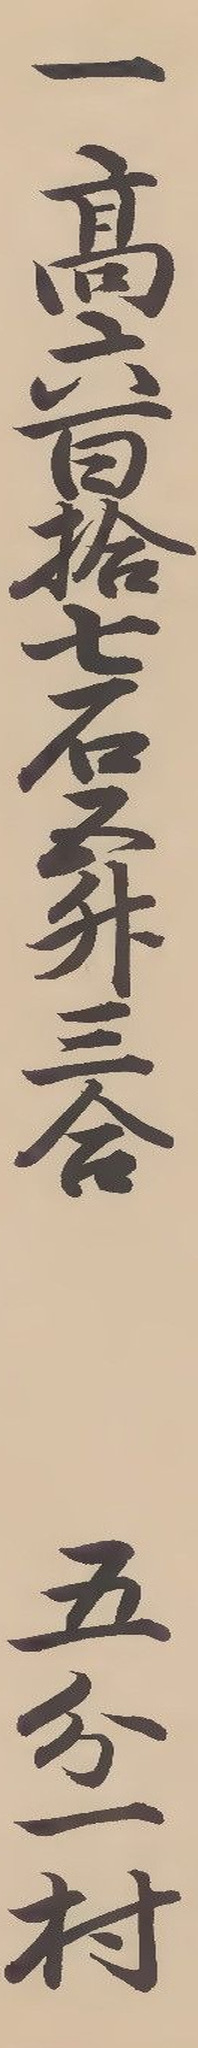一高六百拾七石五升三合五分一村
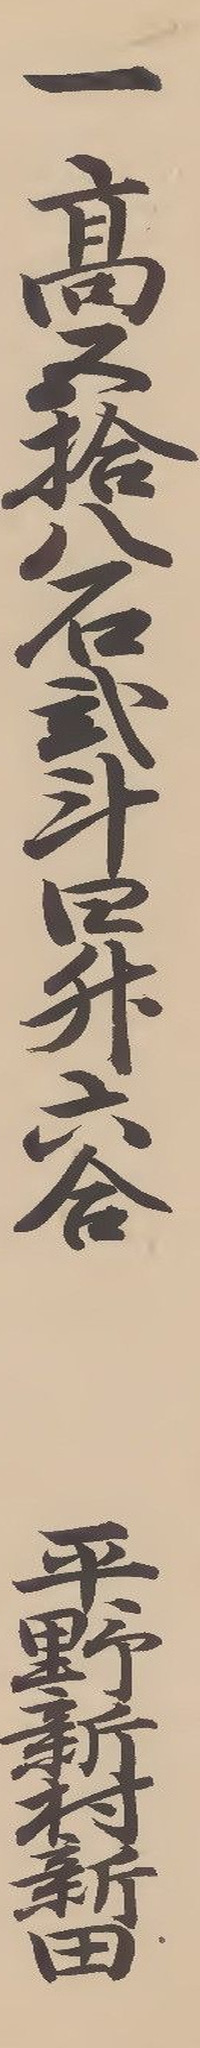一高五拾八石弐斗四升六合平野新村新田
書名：越後国郷帳　中
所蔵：国立公文書館 National Archives of Japan
